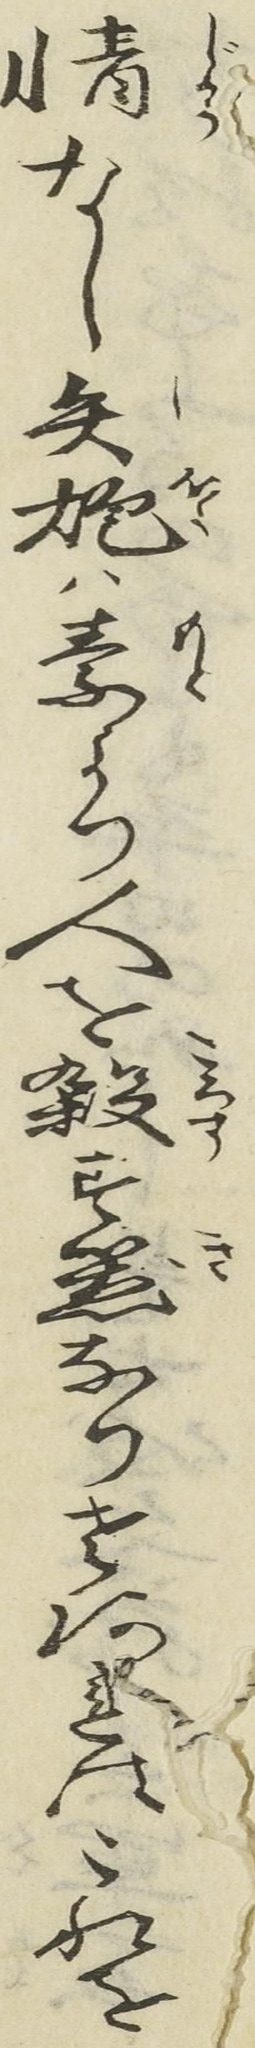情なし矢砲は素より人を殺す器なりさあれはこれを
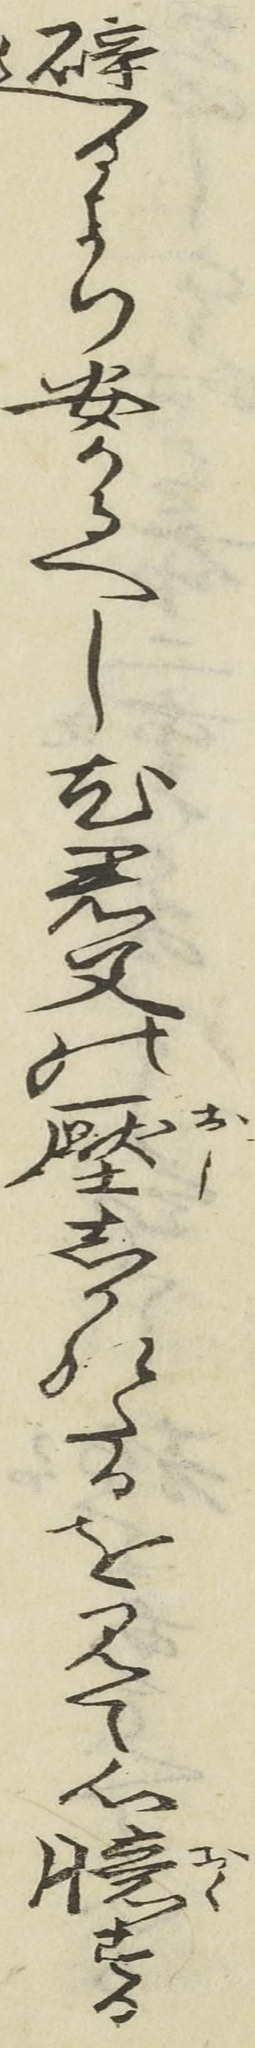避るより安かるへし尤悪文の圧しかれたるを見て心臆する
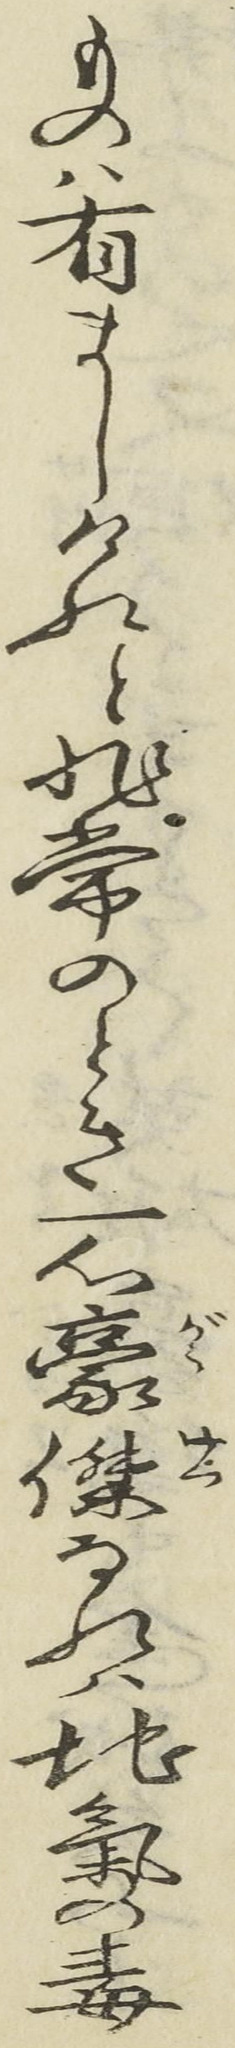ものは有ましけれと非常のとき一心豪傑るれは地気の毒
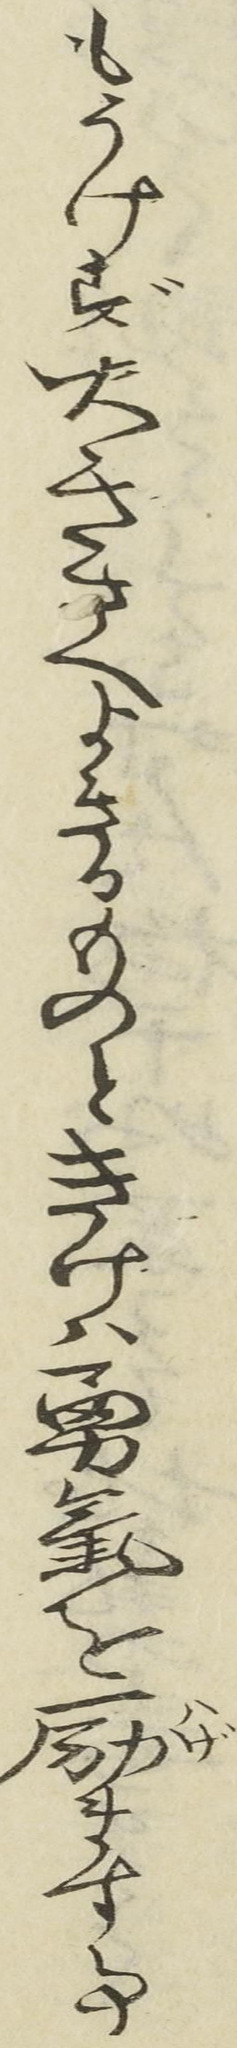もうけず火きさへよきるものときけは勇気を励ます事
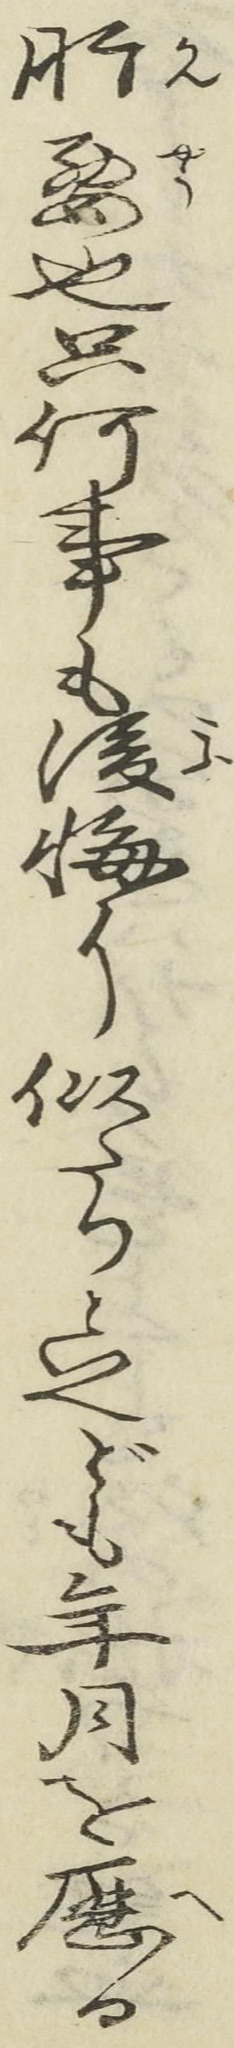肝要也只何事も後悔に似たりといへども年月を歴る
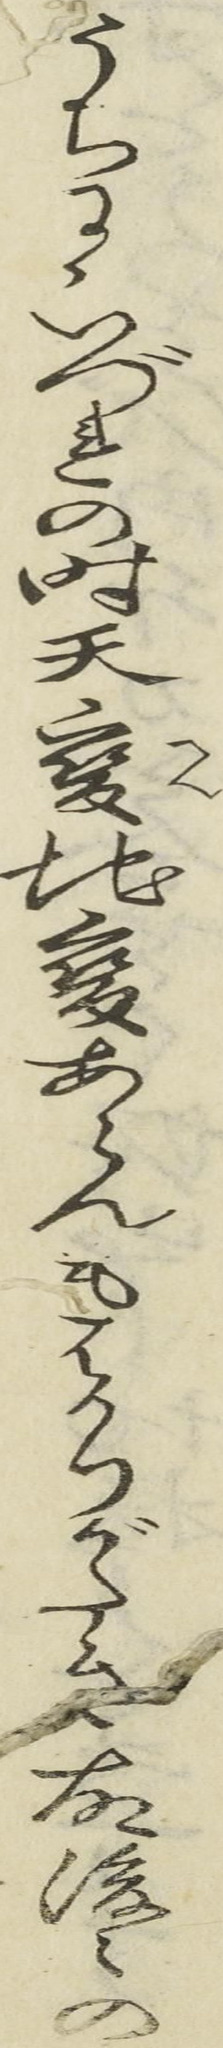うちにかいづれの時天変地変あらんもはかりがたき故後々の
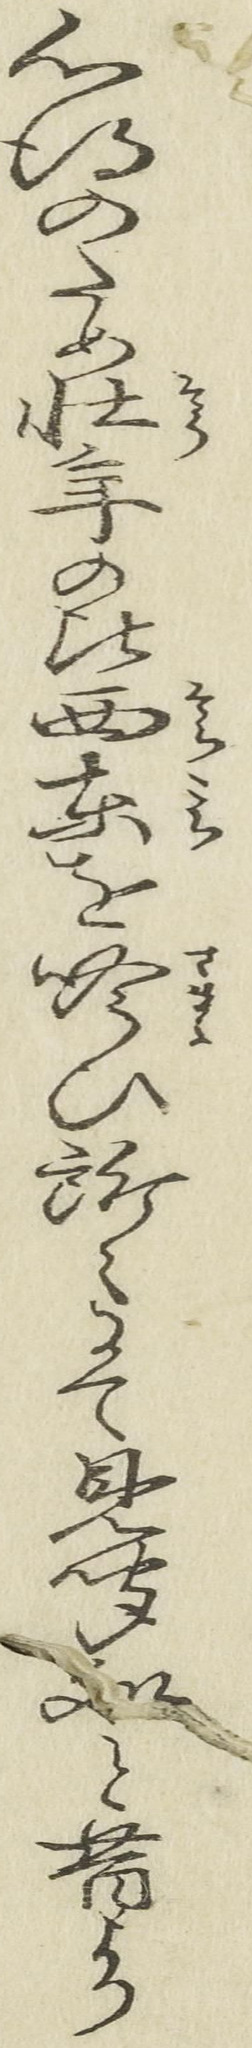心得のため壮年の頃西東を吟ひ所々にて見聞処と昔より
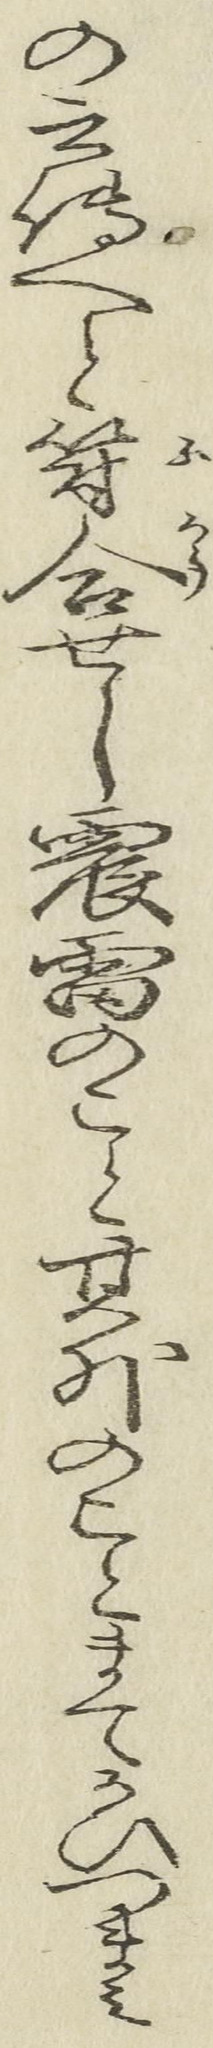の云傳へと符合せし震雷のこと其外のことまてかひつまみ
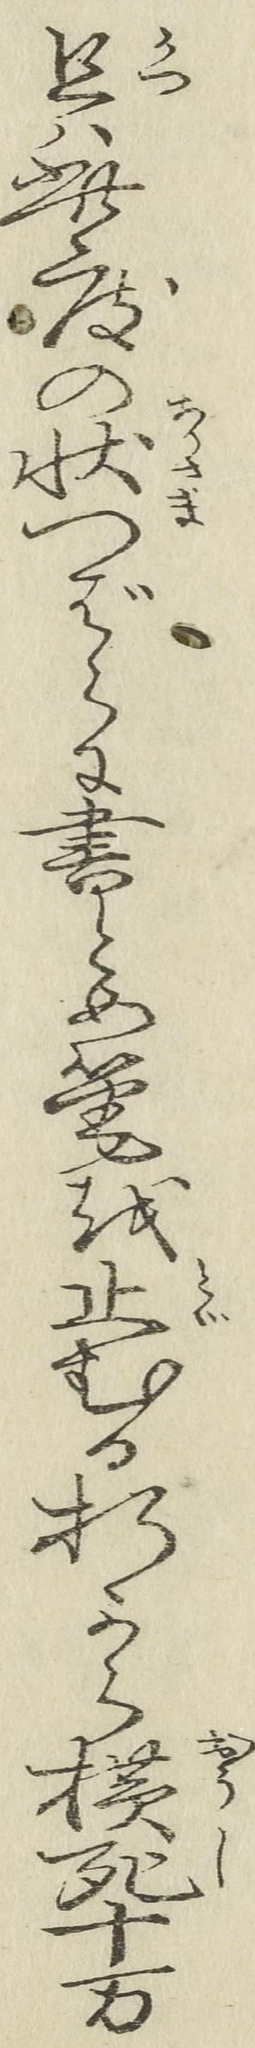且は此度の状つぶらに書とめ筆を止むる折から横死十万
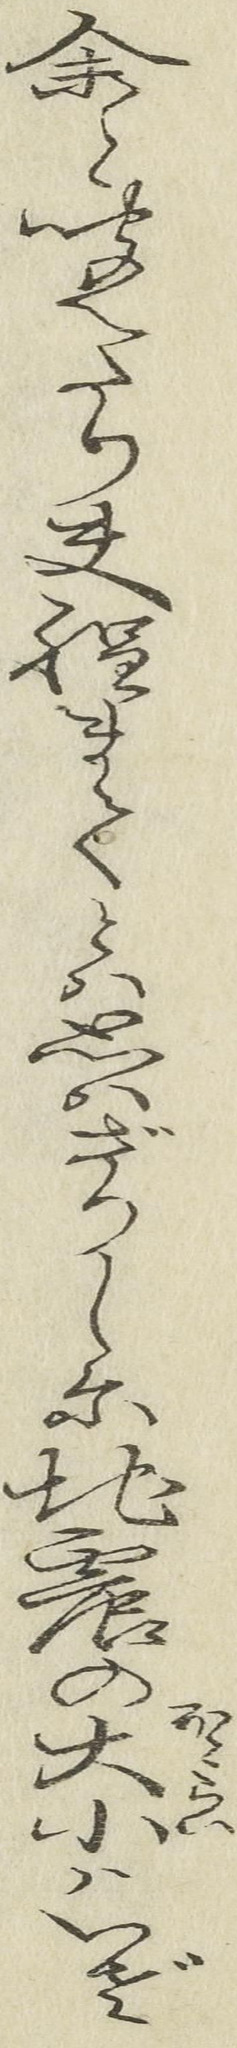余と聞へたり夫程まてとは思わざりしに地震の大小はいざ
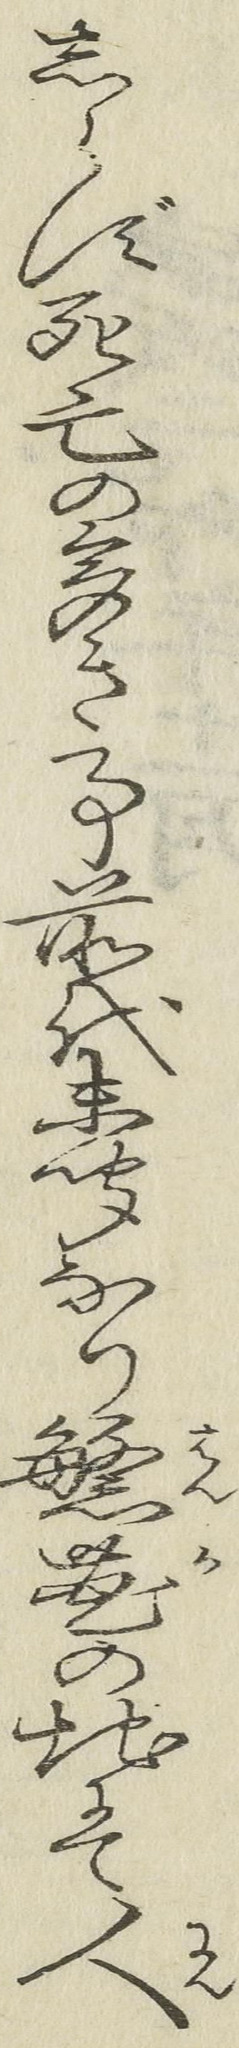しらず死亡の多き事前代未聞なり繁華の地にて人
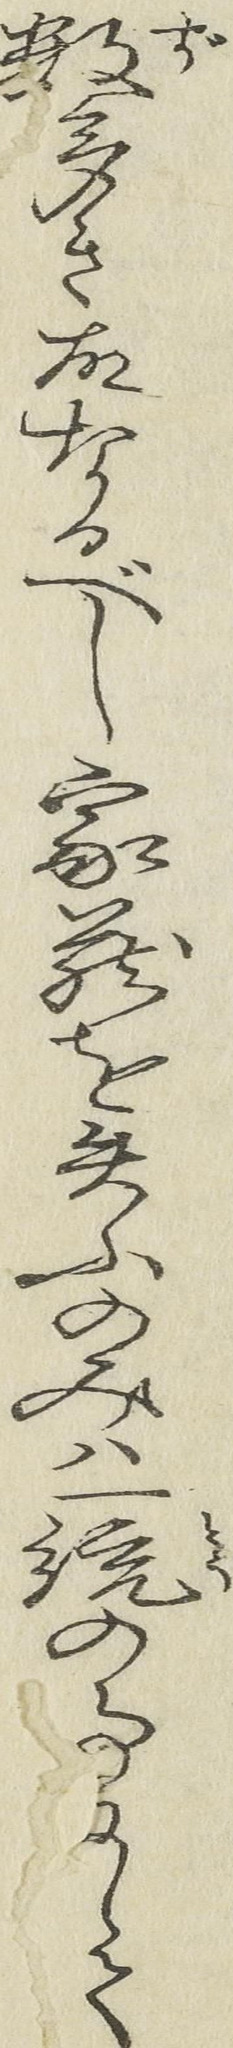数多き故なるべし家蔵を失ふのみは一統の事にして
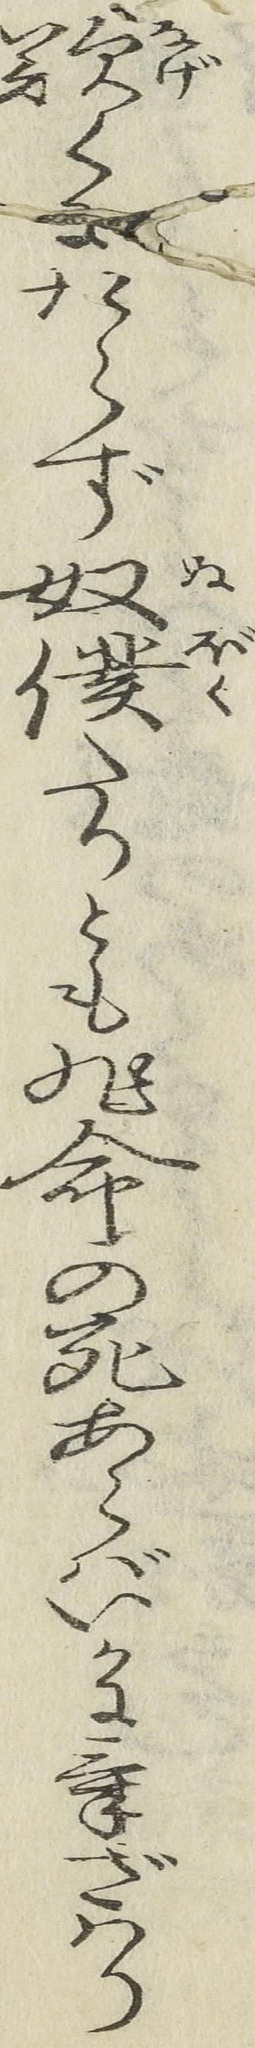歎くにたらず奴僕たりとも非命の死あらばいかに気ざはり
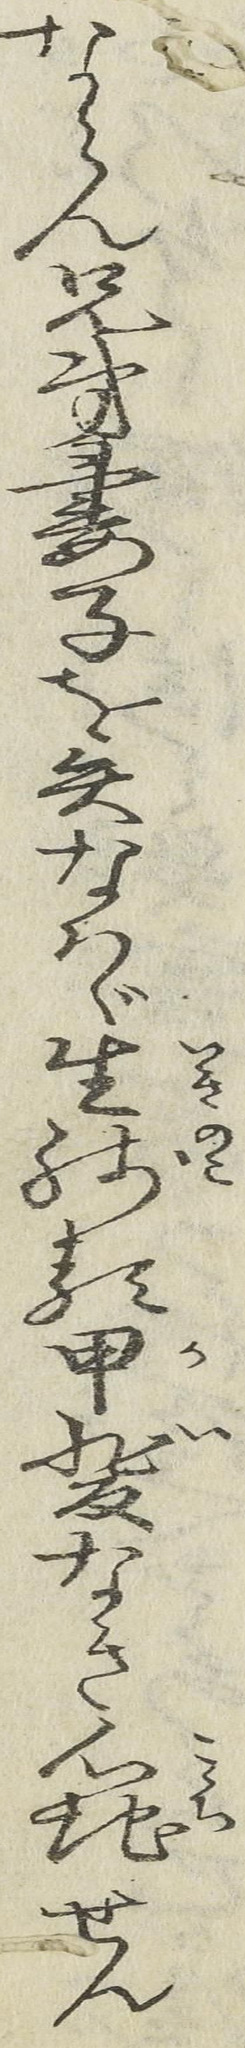ならん兄弟妻子を失なはゞ生残る甲斐なき心地せん
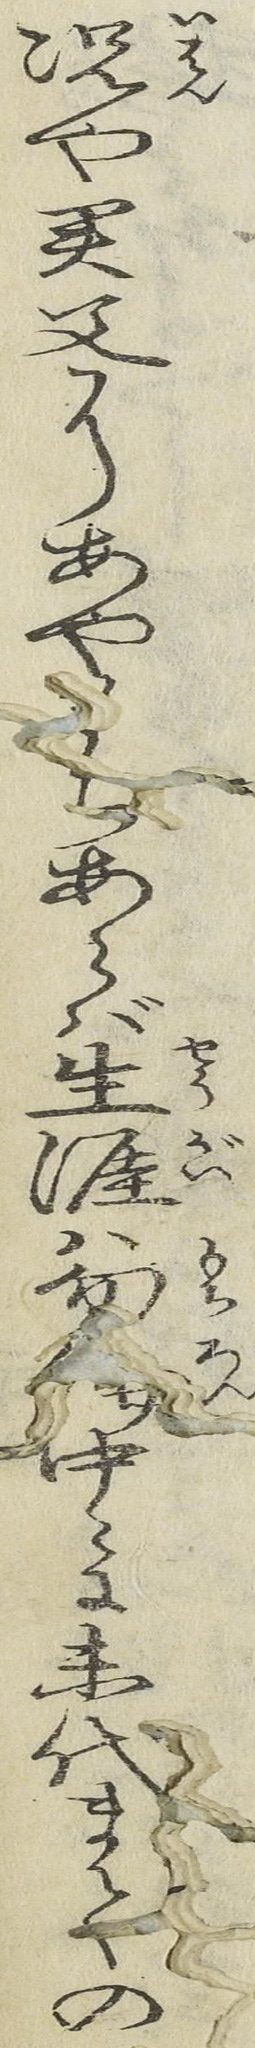況や美文にあやまちあらば生涯は勿論中々に末代まての

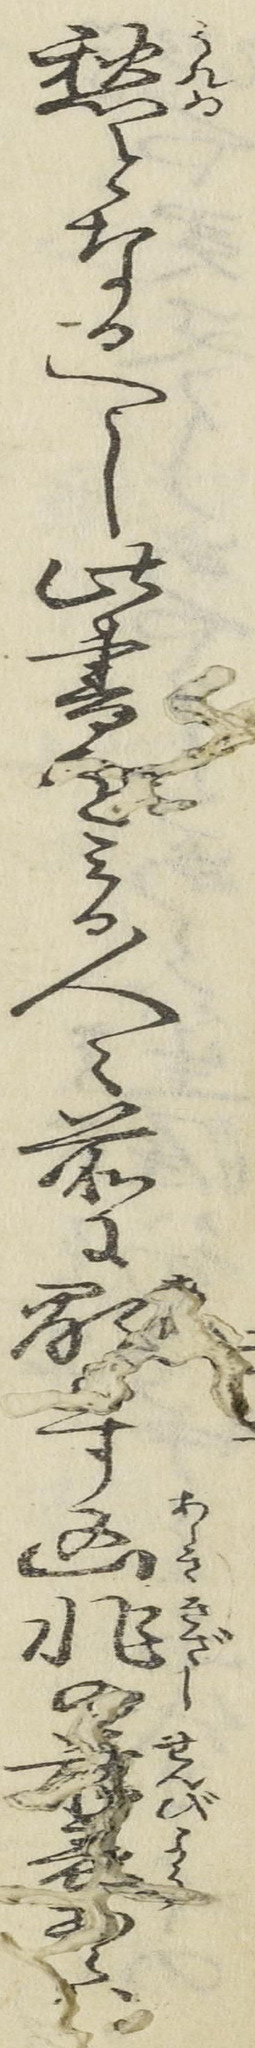愁となるへし此書をみる人々前に顕ハす凶兆の前表あらは
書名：震雷考説　全
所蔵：東京大学地震研究所図書室 Earthquake Research Institute Library, The University of Tokyo, JAPAN
